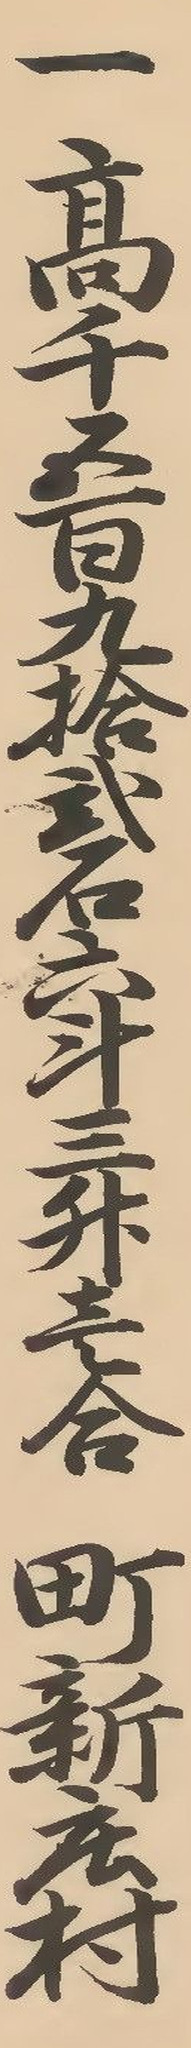一高千五百九拾弐石六斗三升壱合町新庄村

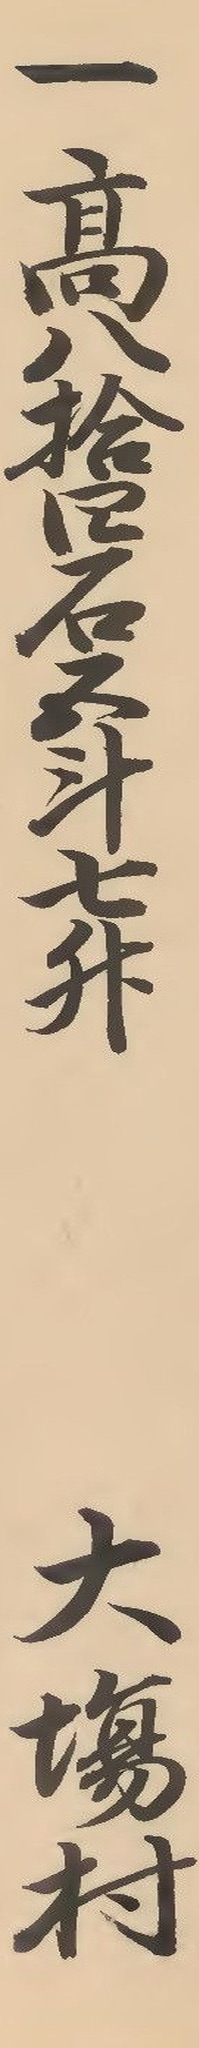一高八拾四石五斗七升大場村
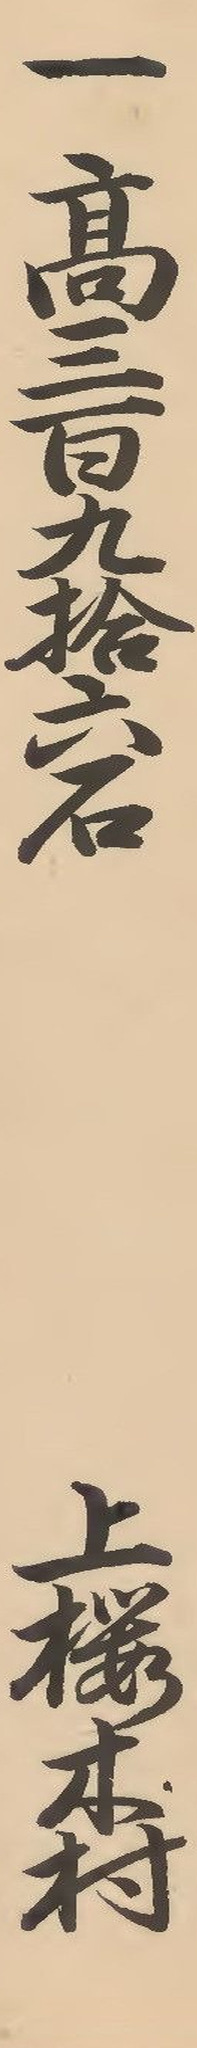一高三百九拾六石上桜木村
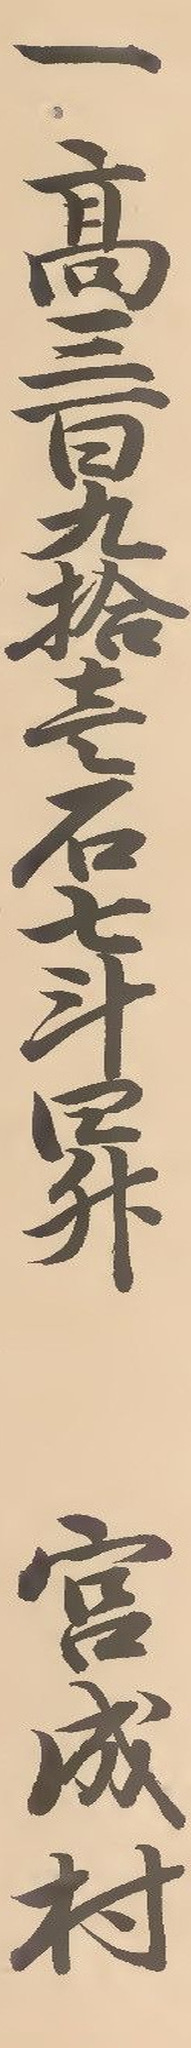一高三百九拾壱石七斗四升宮成村
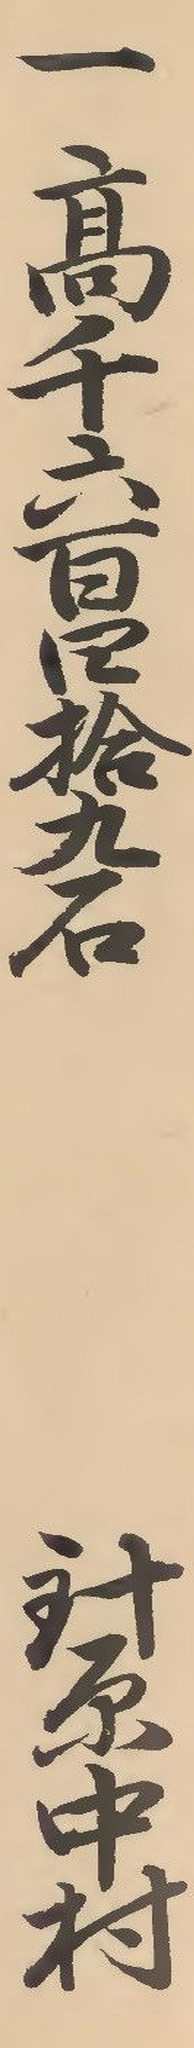一高千六百四拾九石針原中村
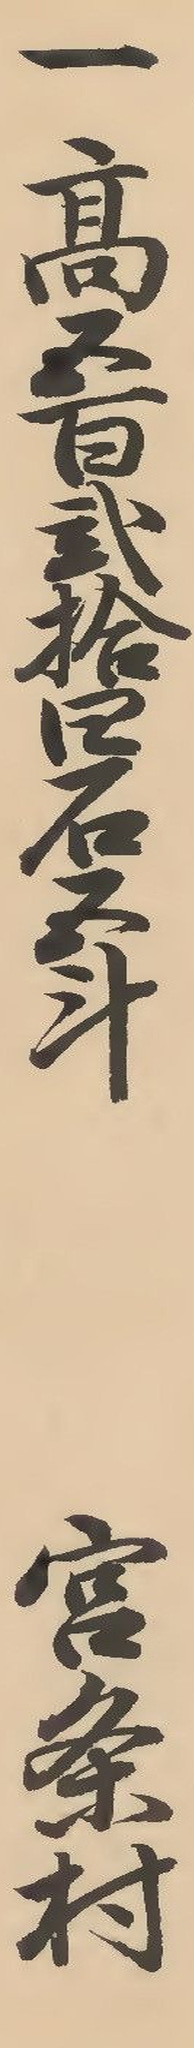一高五百弐拾四石五斗宮条村
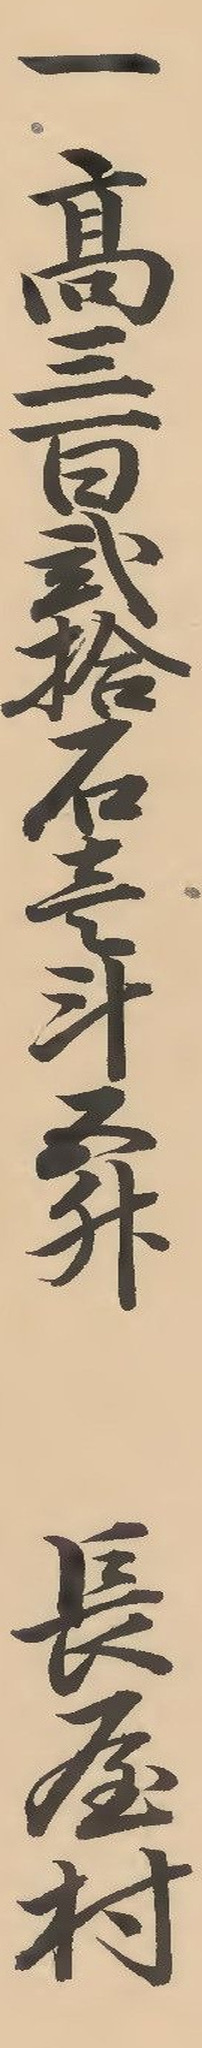一高三百弐拾石壱斗五升長屋村

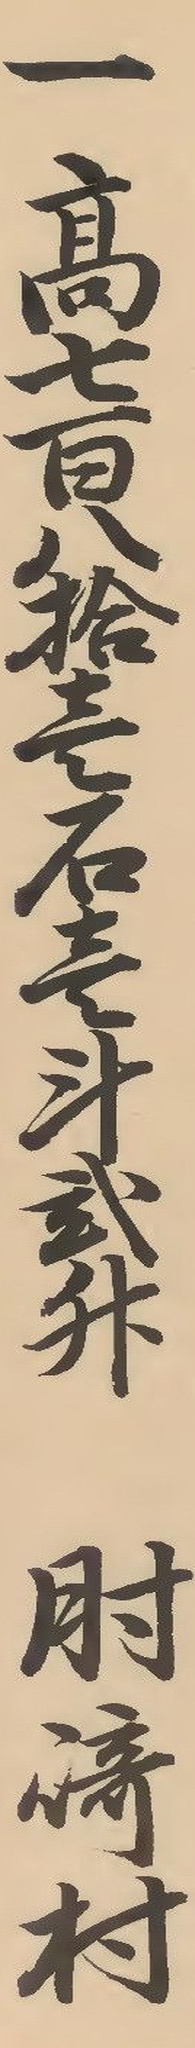一高七百八拾壱石壱斗弐升肘崎村
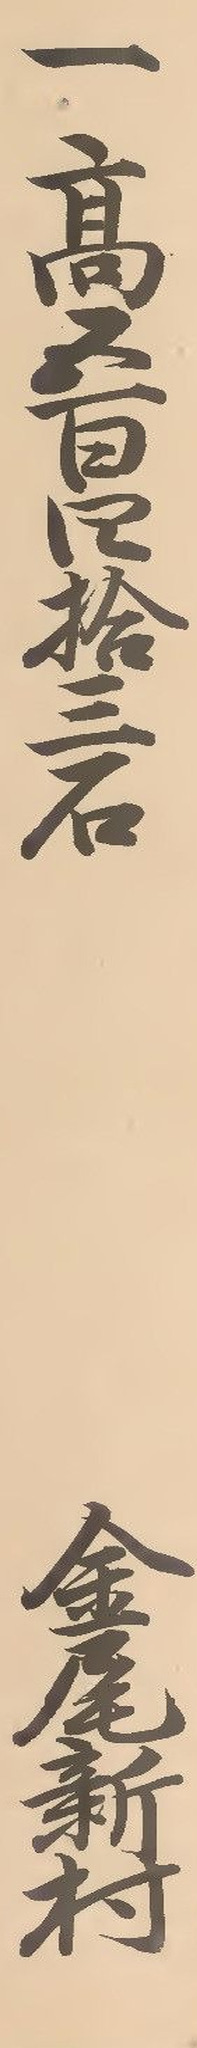一高五百四拾三石金尾新村
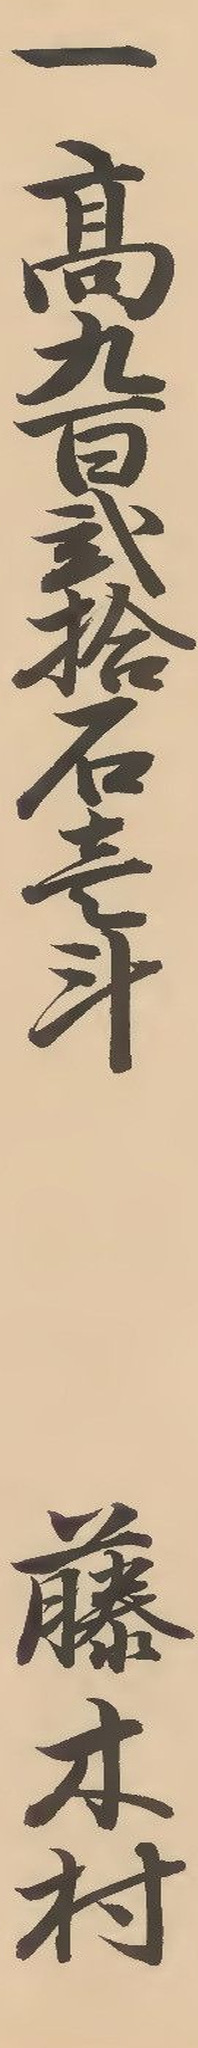一高九百弐拾石壱斗藤木村
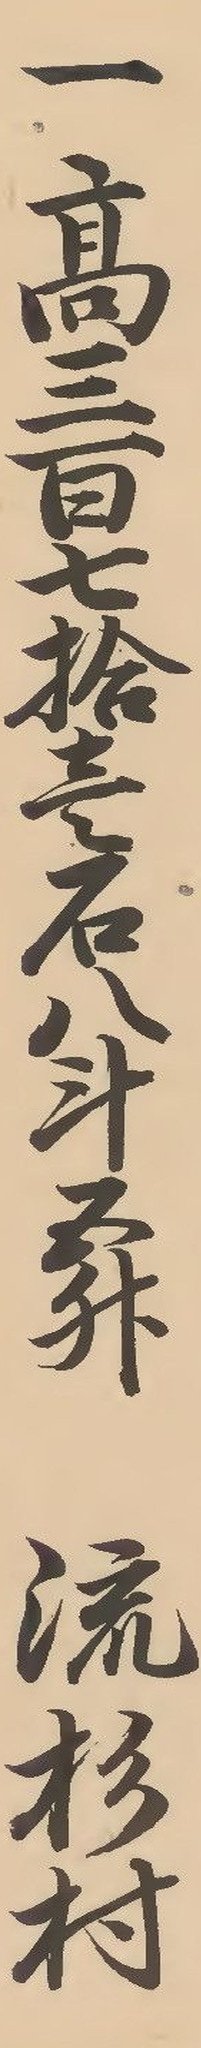一高三百七拾壱石八斗五升流杉村

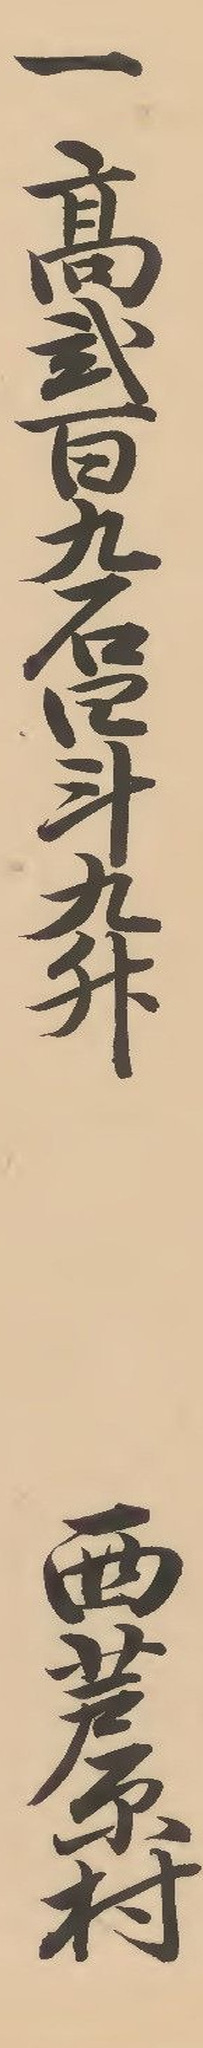一高弐百九石四斗九升西芦原村
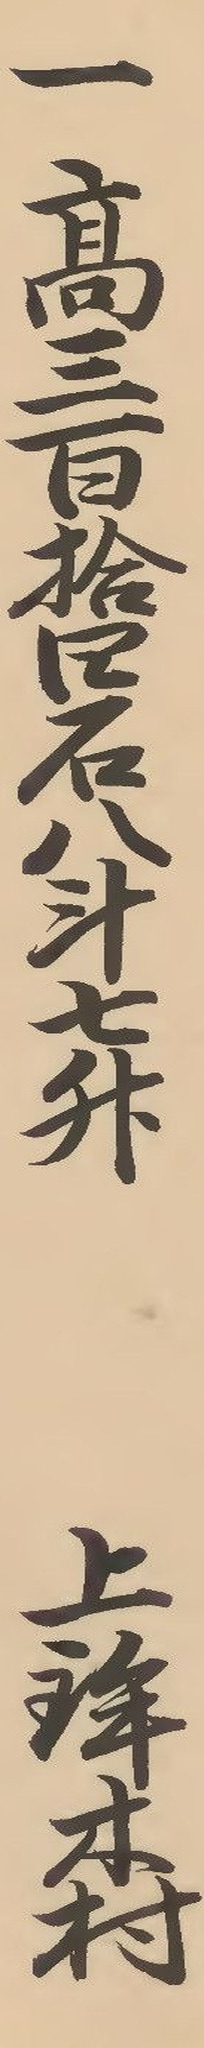一高三百拾四石八斗七升上鉾木村
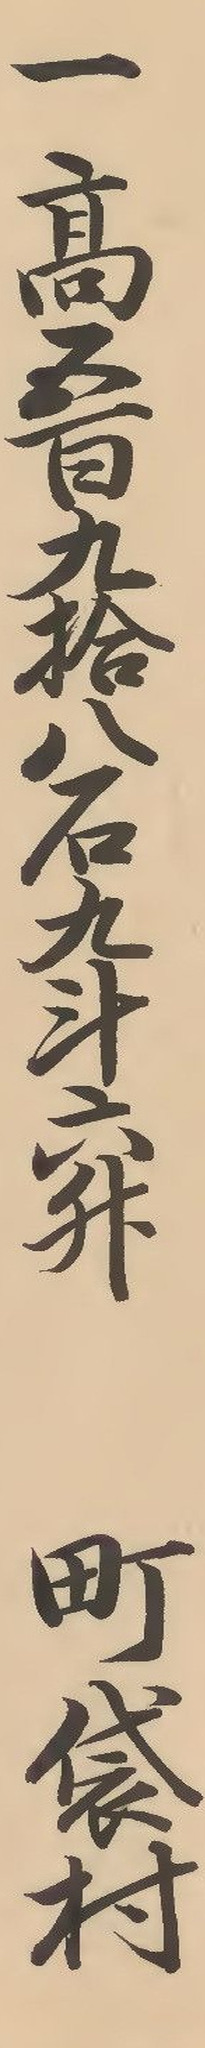一高五百九拾八石九斗六升町袋村
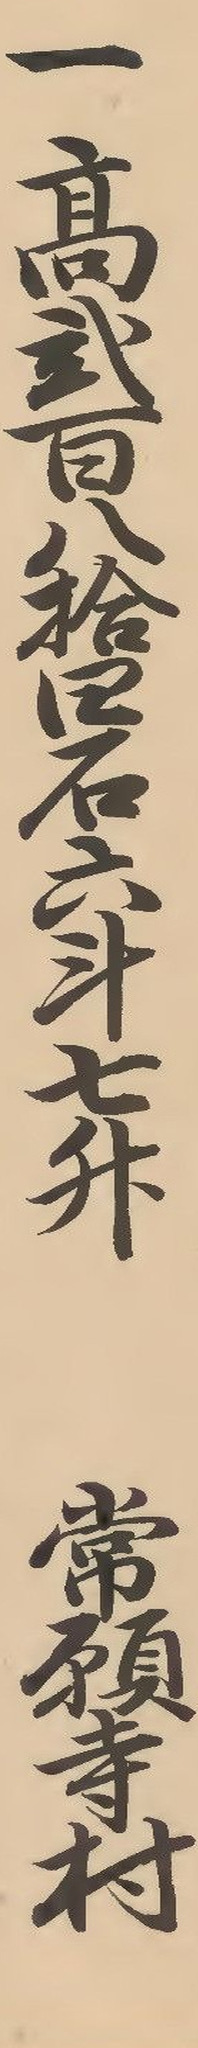一高弐百八拾四石六斗七升常願寺村
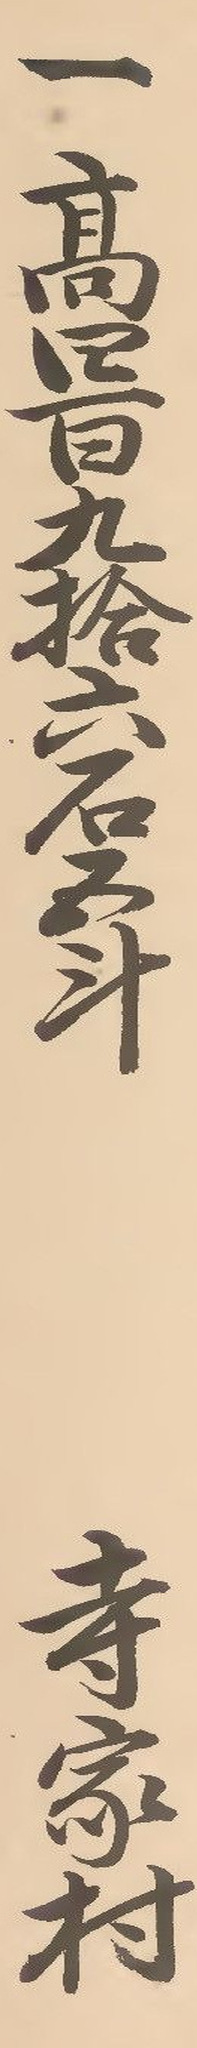一高四百九拾六石五斗寺家村
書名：越中国郷帳
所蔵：国立公文書館 National Archives of Japan
